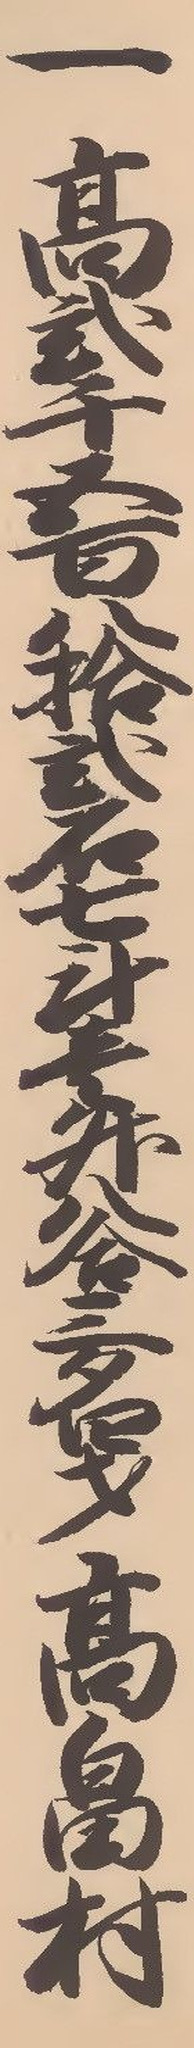一高弐千五百八拾弐石七斗壱升八合三勺四才高畠村
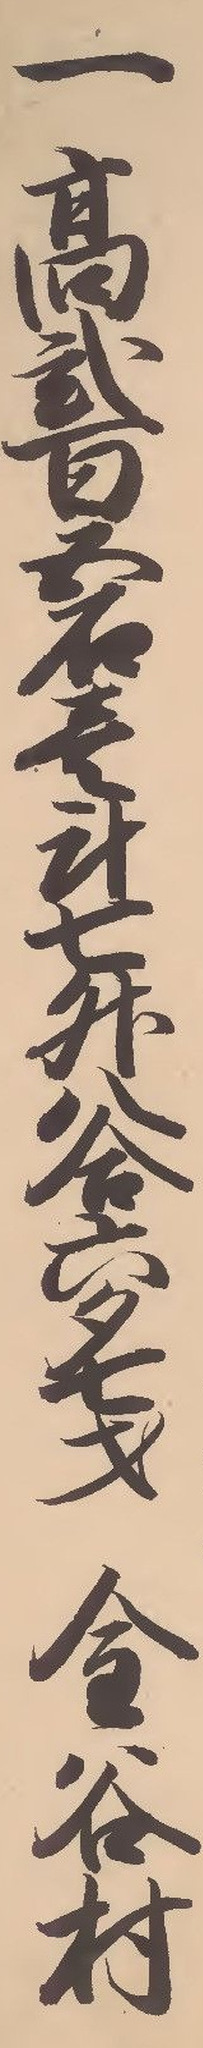一高弐百五石壱斗七升八合六勺七才金谷村

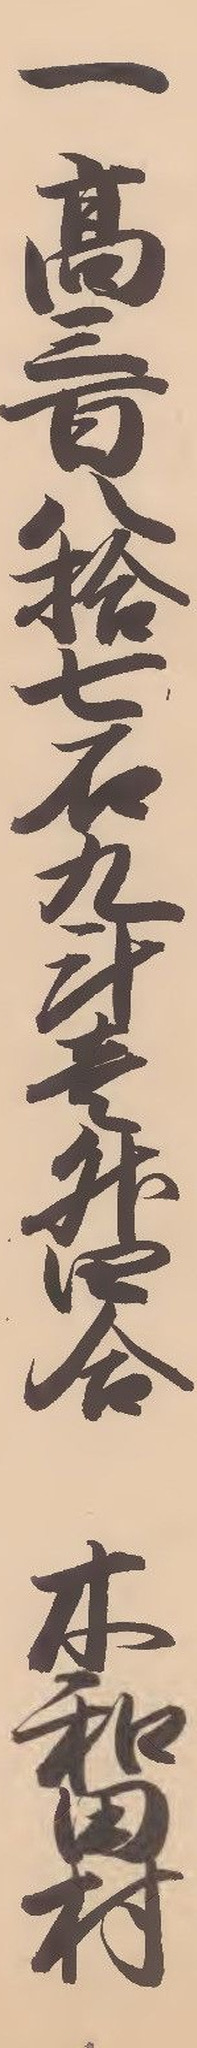一高三百八拾七石九斗壱升四合木和田村
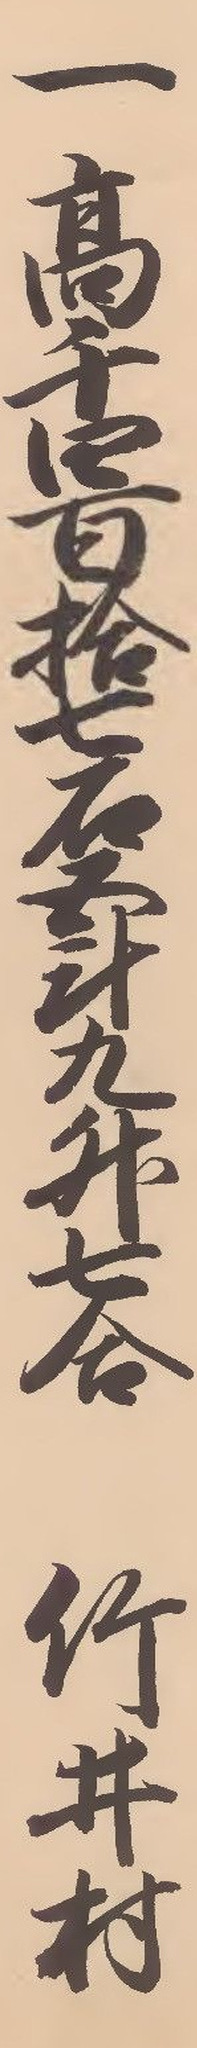一高千四百拾七石五斗九升七合竹井村
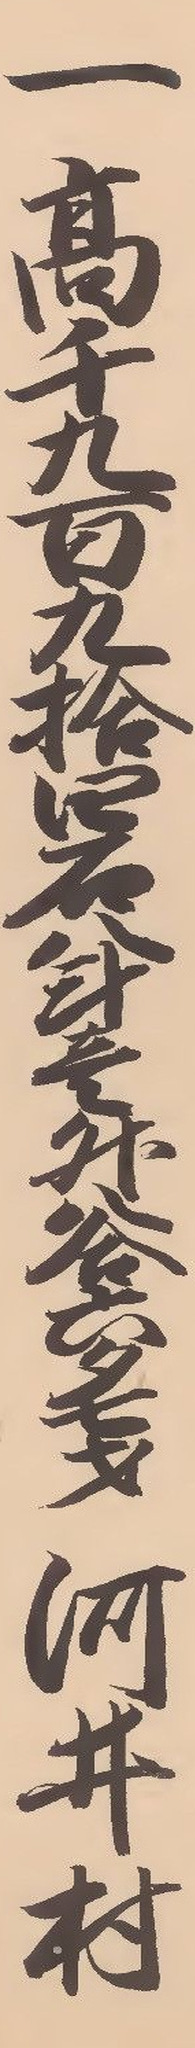一高千九百九拾四石八斗壱升八合六勺七才河井村
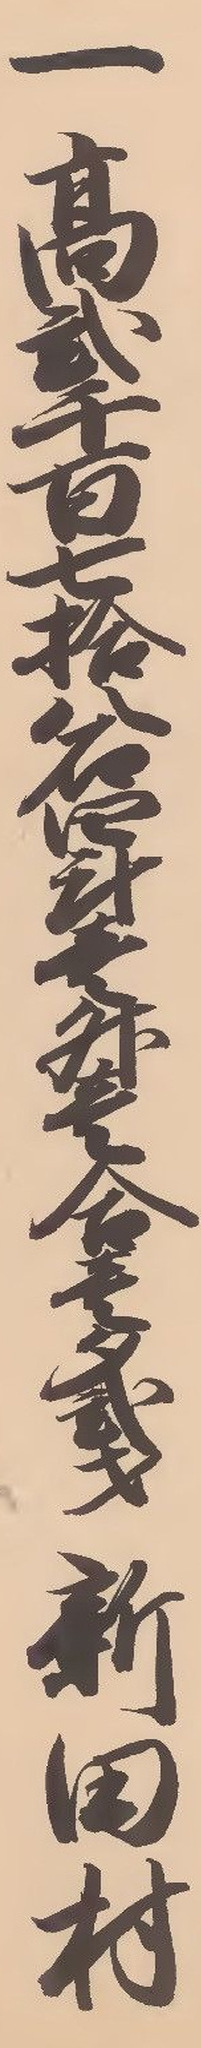一高弐千百七拾八石四斗壱升壱合壱勺弐才新田村
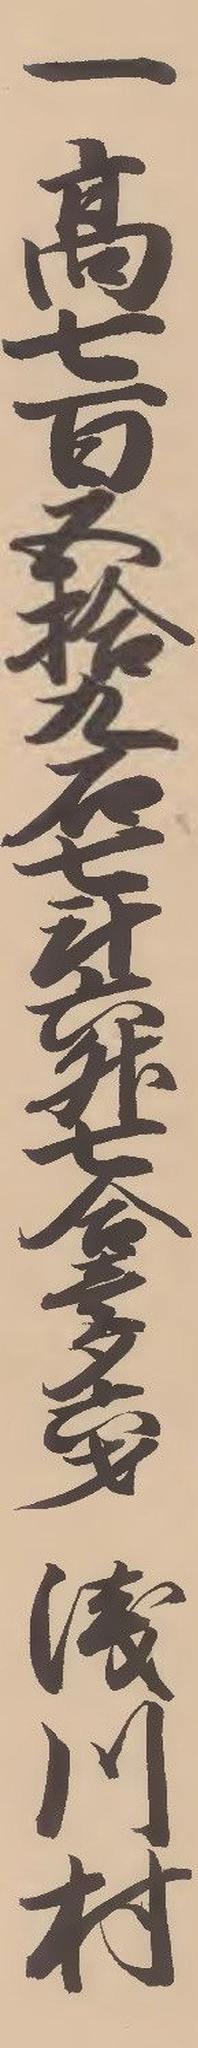一高七百五拾九石七斗六升七合壱勺六才浅川村
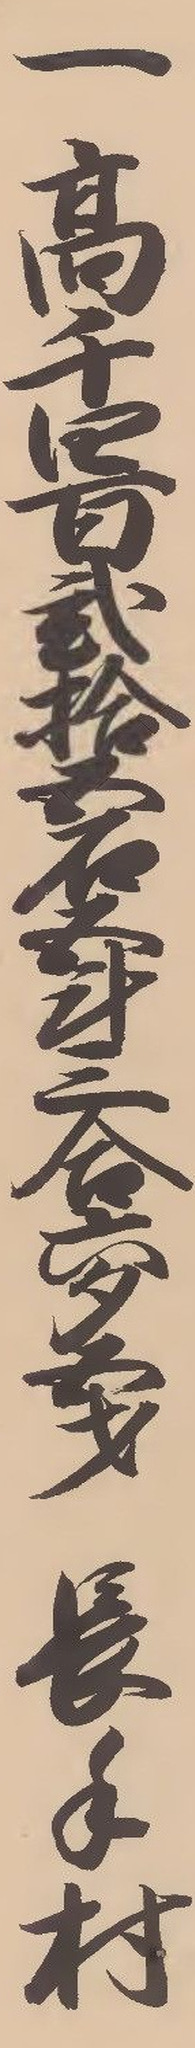一高千四百弐拾五石五斗三合六勺五才長手村
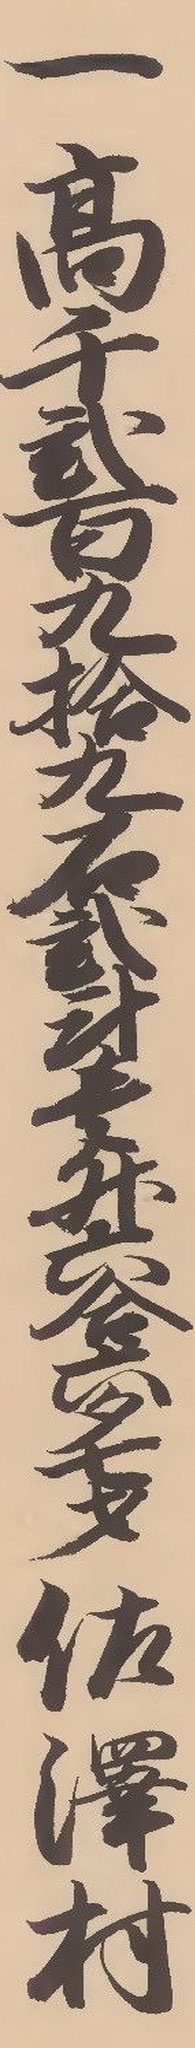一高千弐百九拾九石弐斗壱升六合六勺七才佐沢村
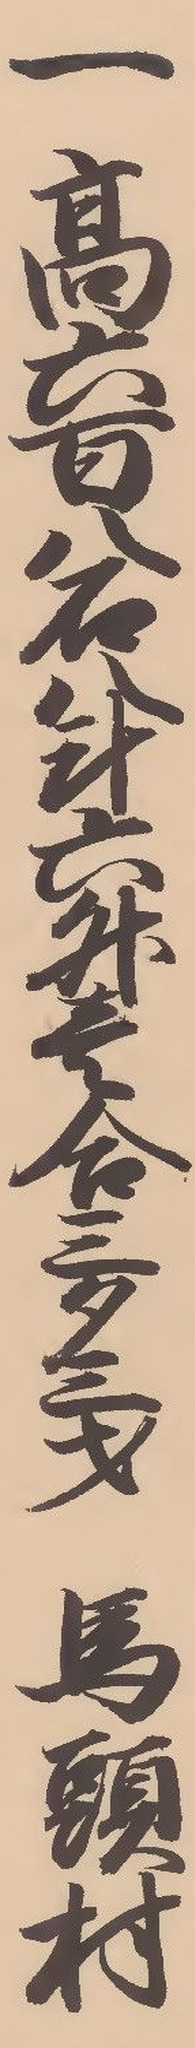一高六百八石八斗六升壱合三勺三才馬頭村

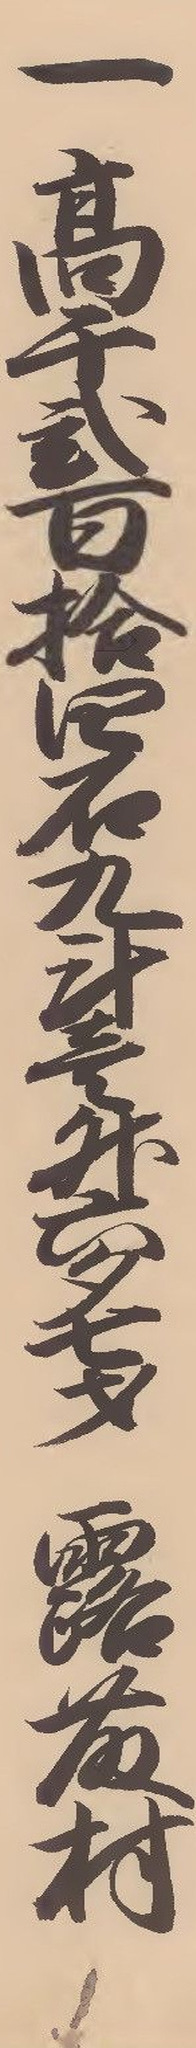一高千弐百拾四石九斗壱升六勺六才露藤村
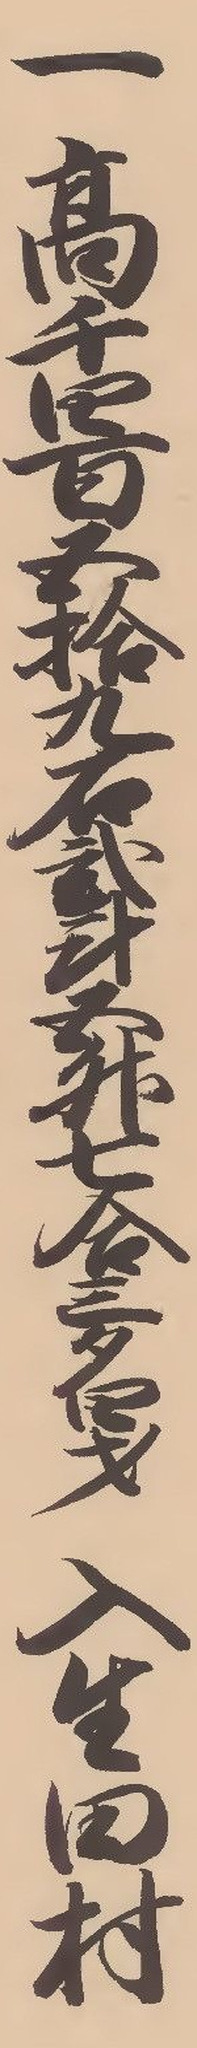一高千四百五拾九石弐斗五升七合三勺四才入生田村
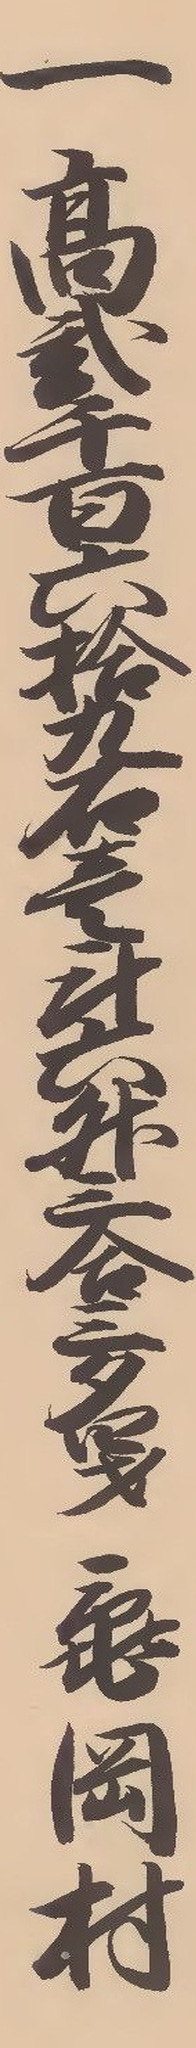一高弐千百六拾九石壱斗六升三合三勺四才亀岡村
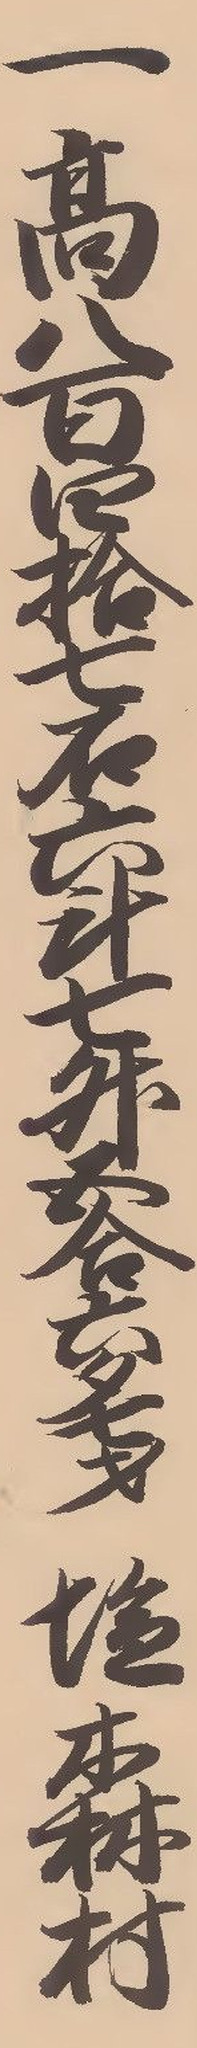一高八百四拾七石六斗七升五合六勺七才塩森村
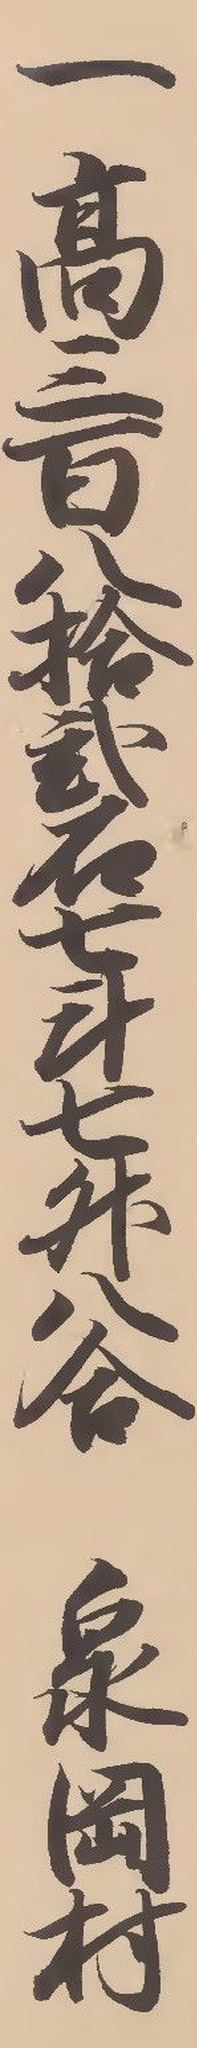一高三百八拾弐石七斗七升八合泉岡村
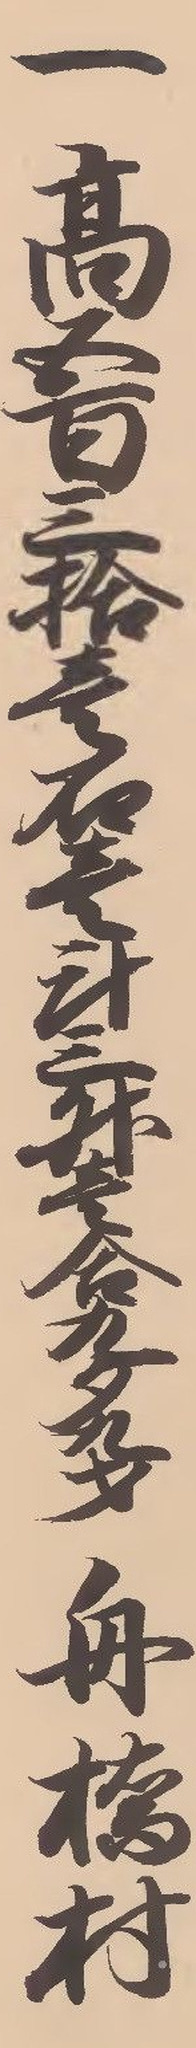一高五百三拾壱石壱斗三升壱合九勺九才船橋村
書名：出羽国郷帳　１
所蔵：国立公文書館 National Archives of Japan
